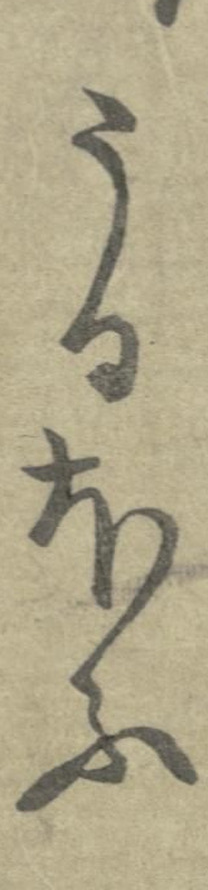うるほふ
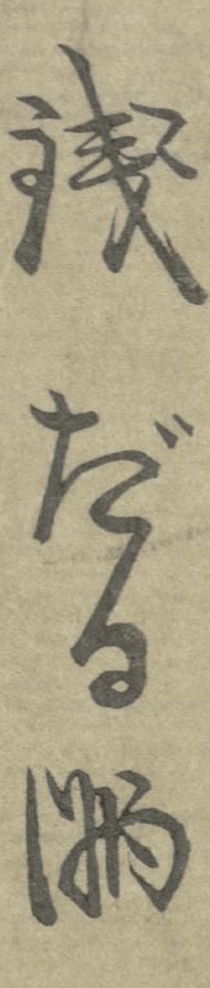銭だるま
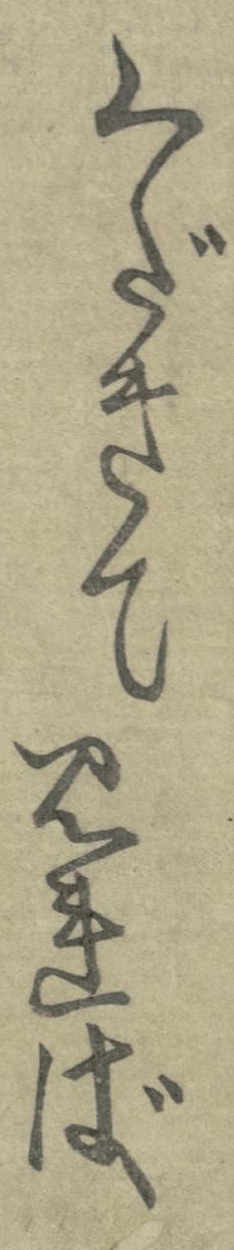くだきてみれば
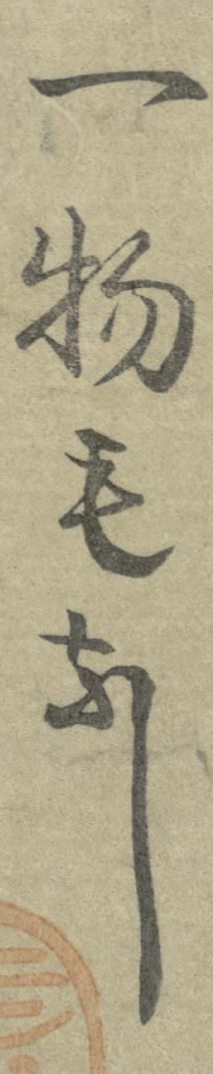一物もなし
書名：[かべ土も落ちてうるおふ銭だるま]
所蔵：東京大学地震研究所図書室 Earthquake Research Institute Library, The University of Tokyo, JAPAN
